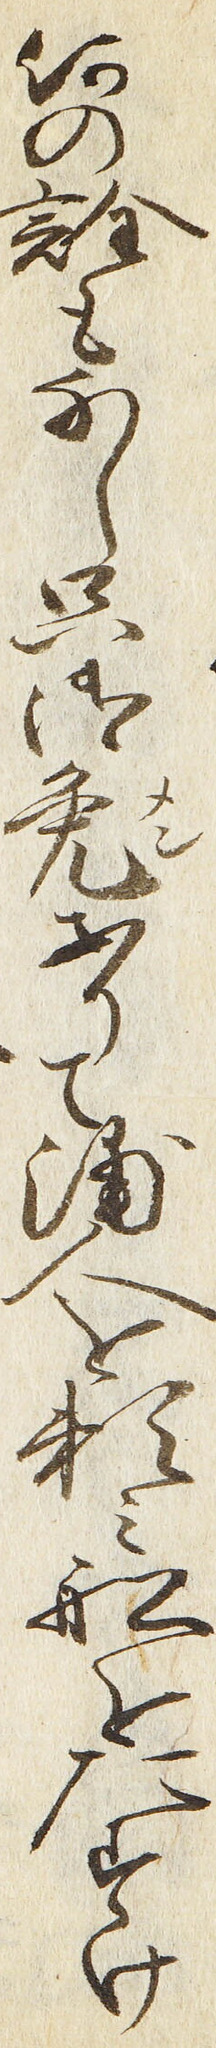何の詮もなし只御免ありて浦人を頼み船をたすけ
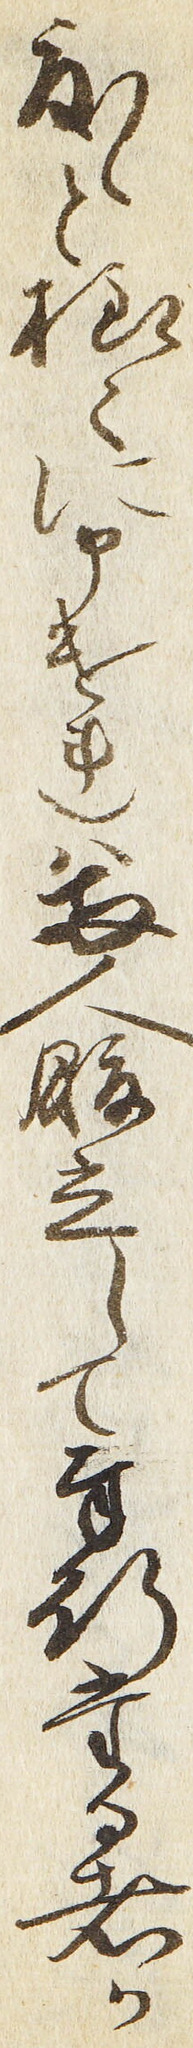度しと様々に申けれは両人腹立して奉行たる者か
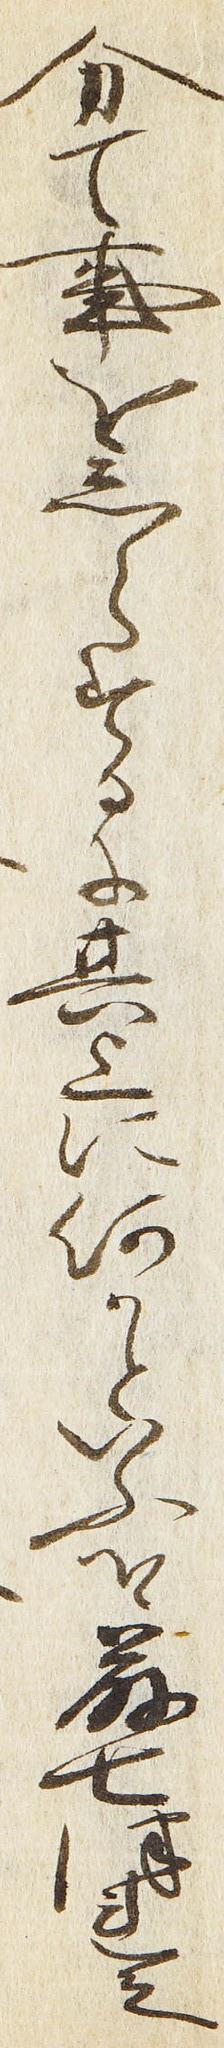分て事をしらするに其上に何かといふそ藤七つれて
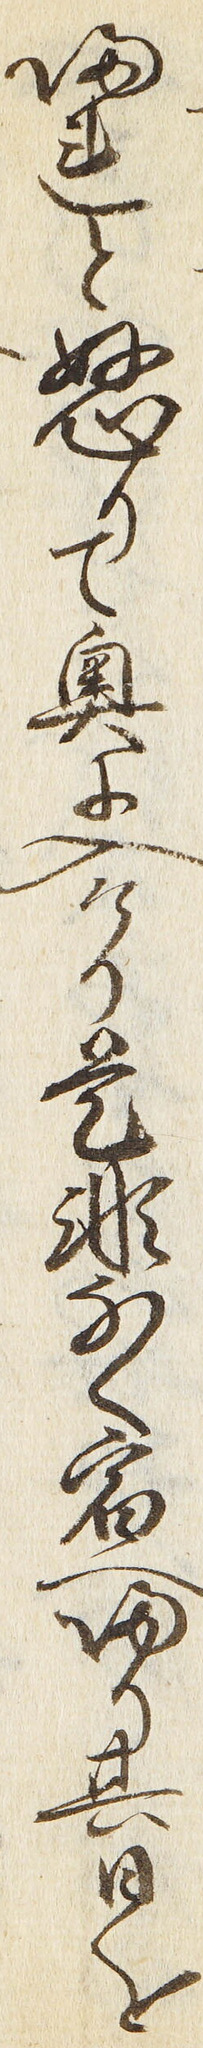帰れと怒りて奥に入けり是非なく宿へ帰り其日を
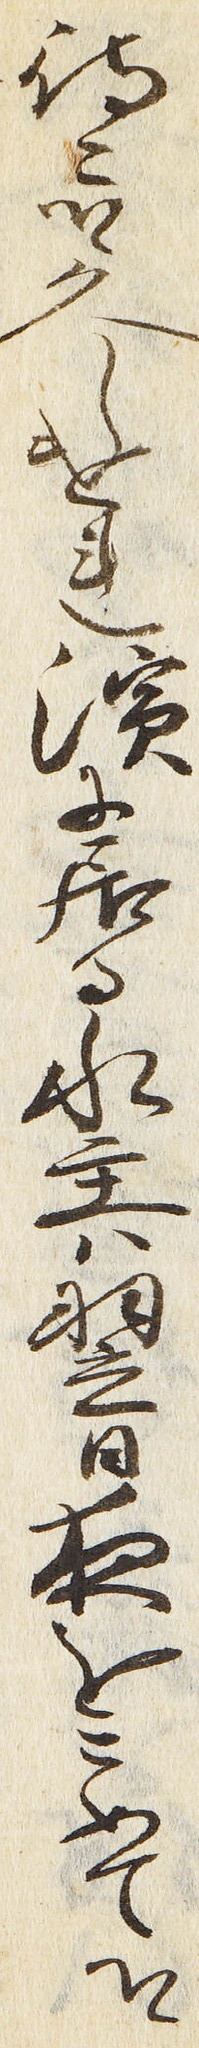待こそ久しけれ浜に居る水主ハ翌日夜をこめてそ
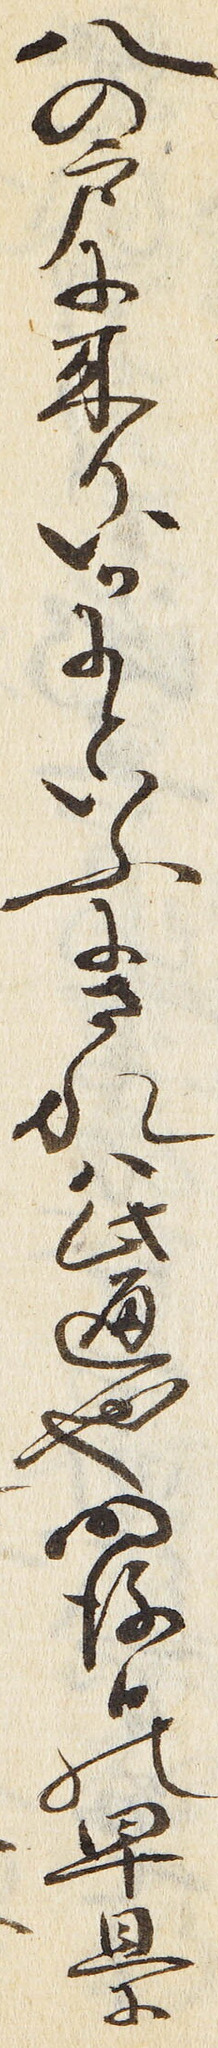八の戸に来りいかにといふにされは此通也明後日の早旦に
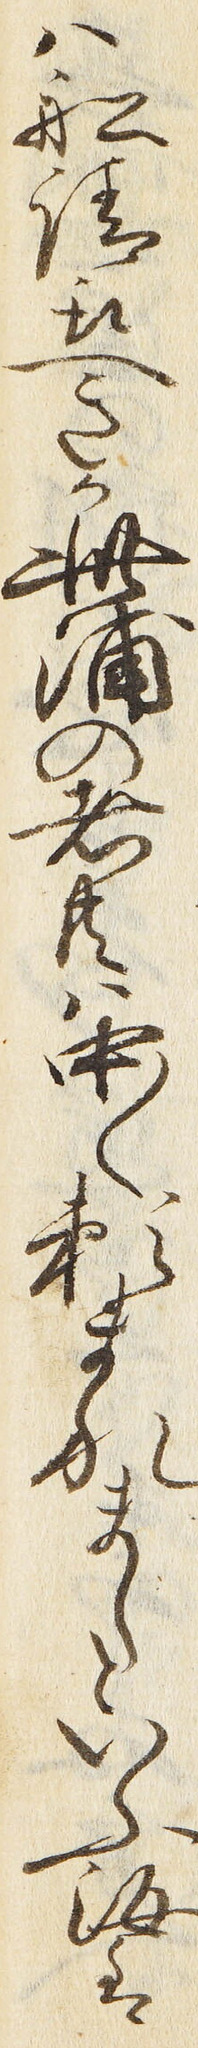は船請取へきか此浦の者共は中〳〵頼まれましといふ汝は
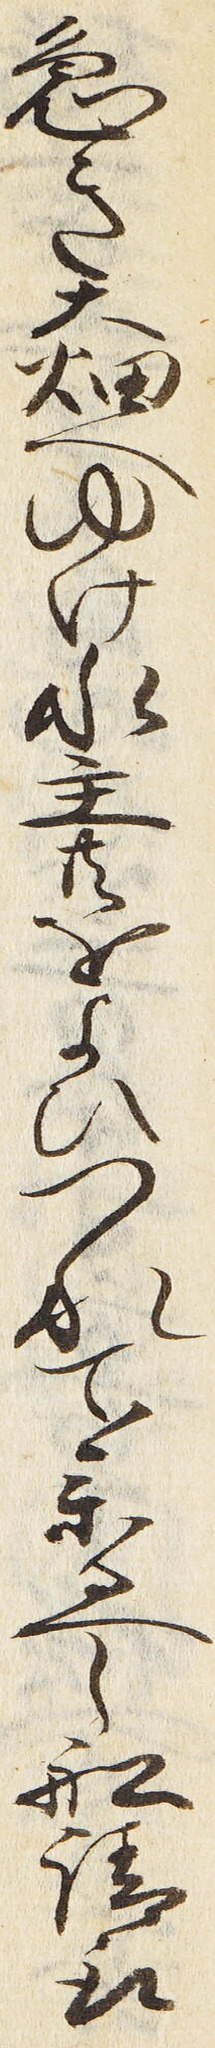急き大畑へゆけ水主共をよひつれて参るへし船請取
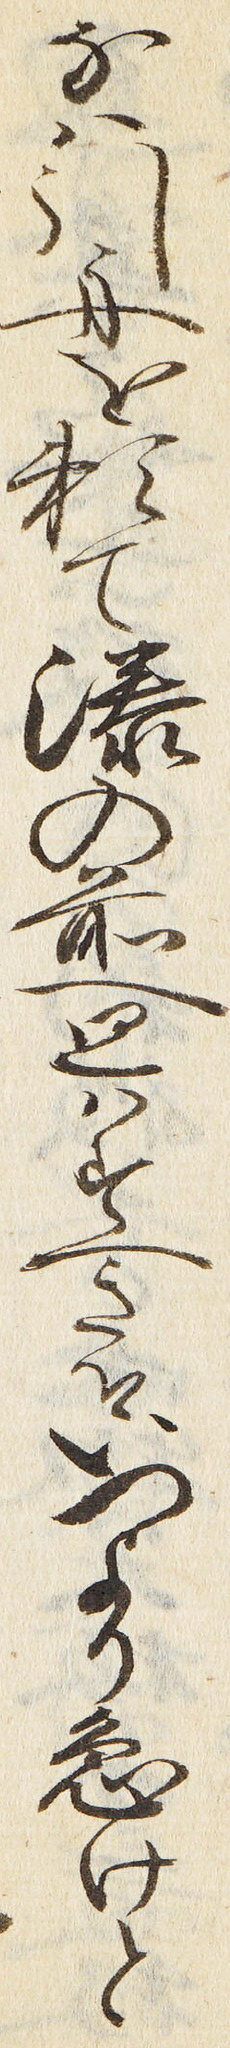なは引舟を頼て湊の前へ廻はすへきそいつより急けと
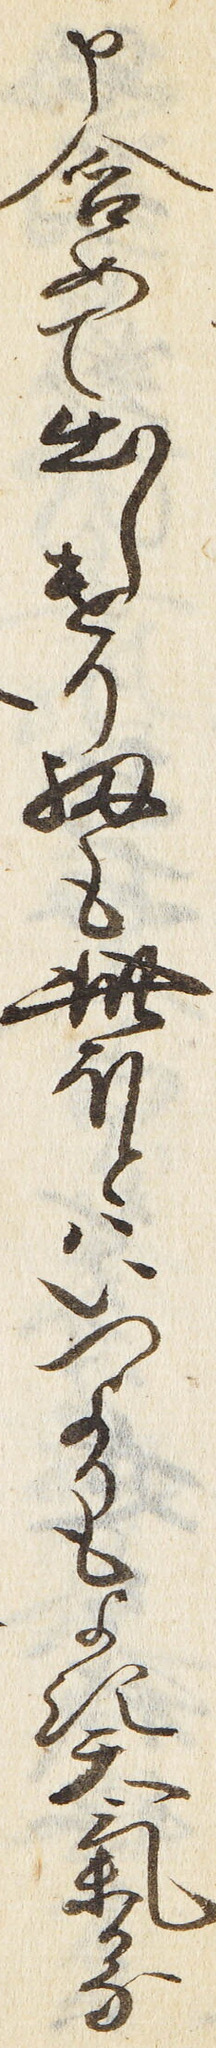申含めて出しけり扨も此ほとはいつよりもよき天気かな
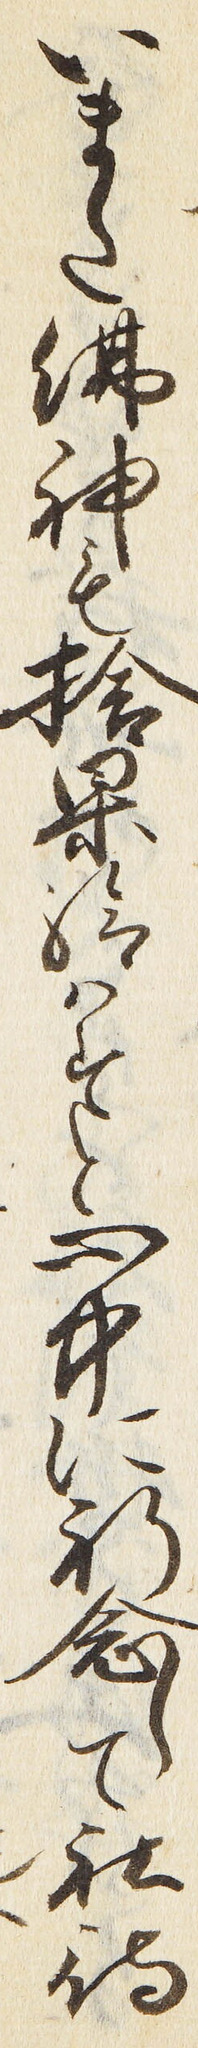いまた仏神も捨果給はすと心中に祈念して社待
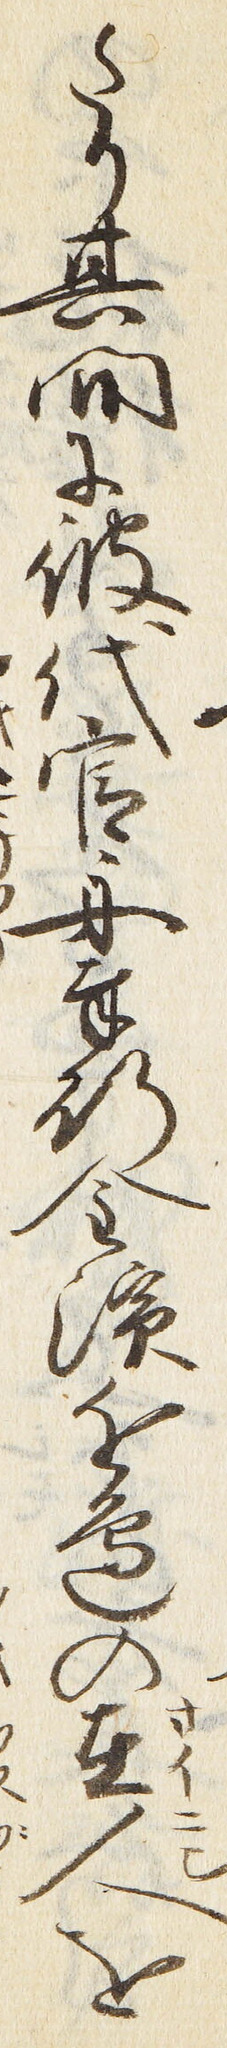たり其間に彼代官舟奉行金浜近辺の在人を
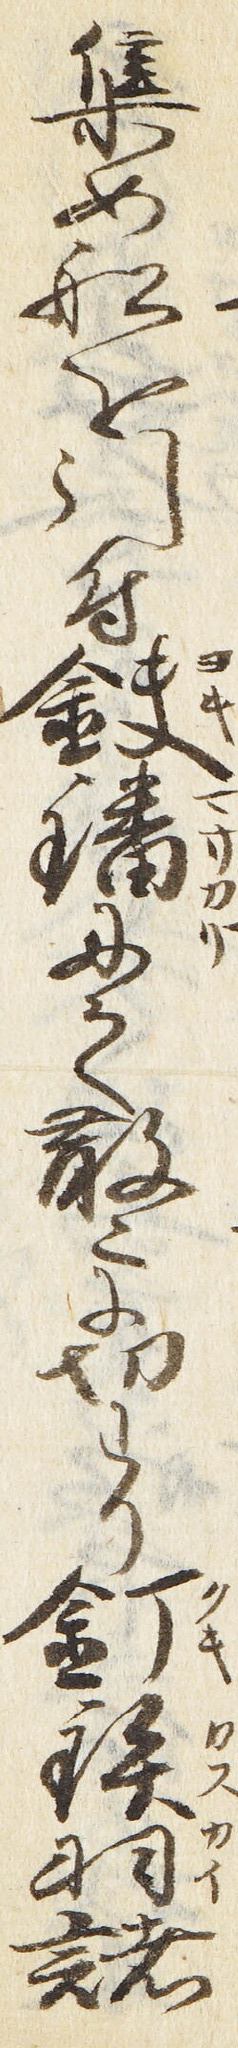集め船を引付鈇鐇にて散々に切わり釘鉄羽諸
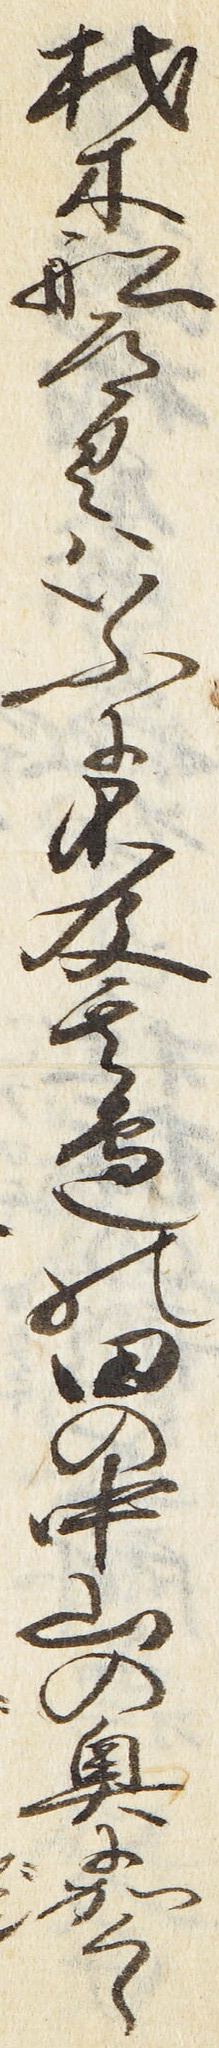材木船道具はいふに不及其辺の田の中山の奥にかくし
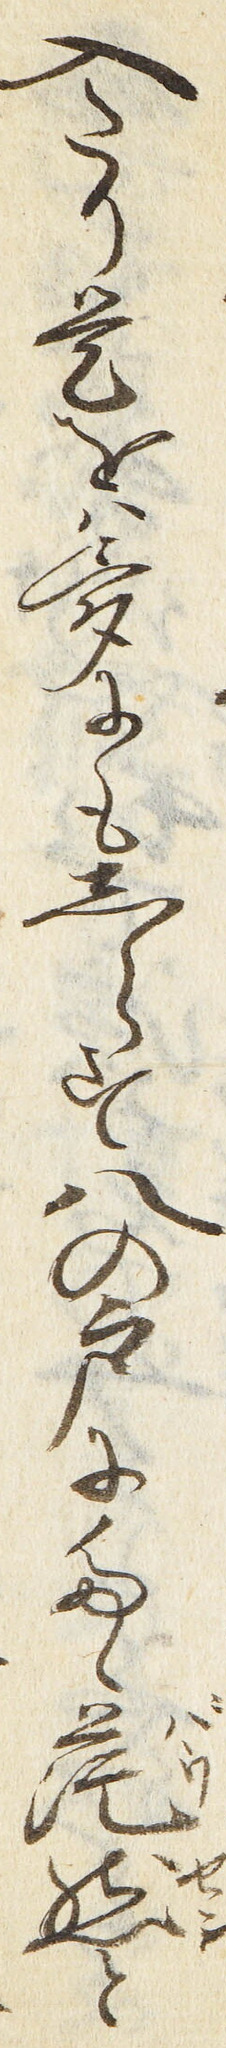入たり是をは夢にもしらす八の戸にたゝ茫然と
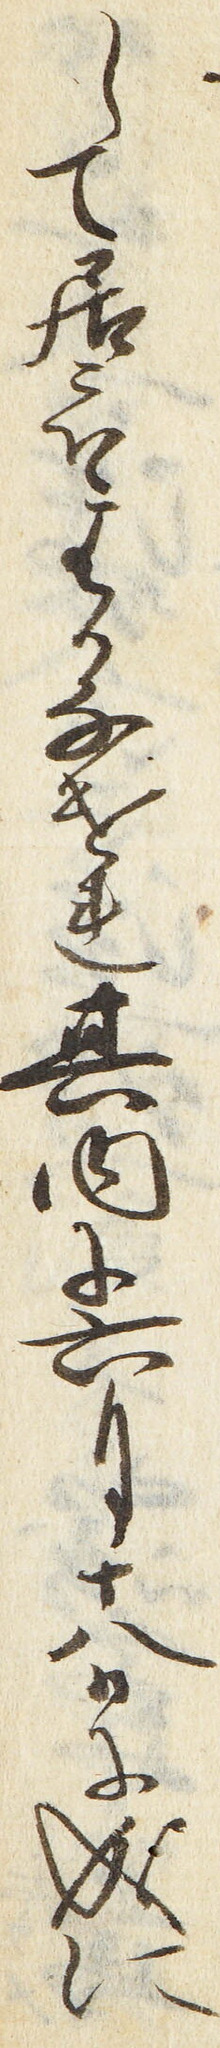して居こそはかなけれ其内に六月十八日に成に
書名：海陸世話日記
